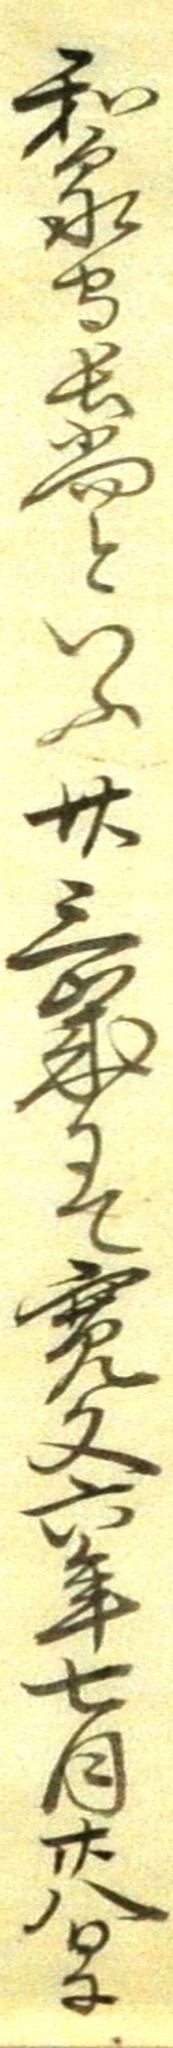和泉守長尚といふ廿三歳にて寛文六年七月廿八日に
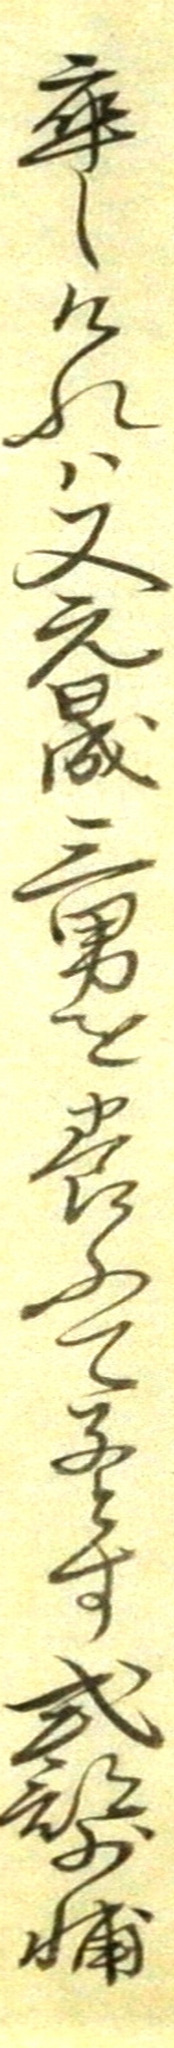卒しけれは又元晟三男を養ふて子とす式部少輔
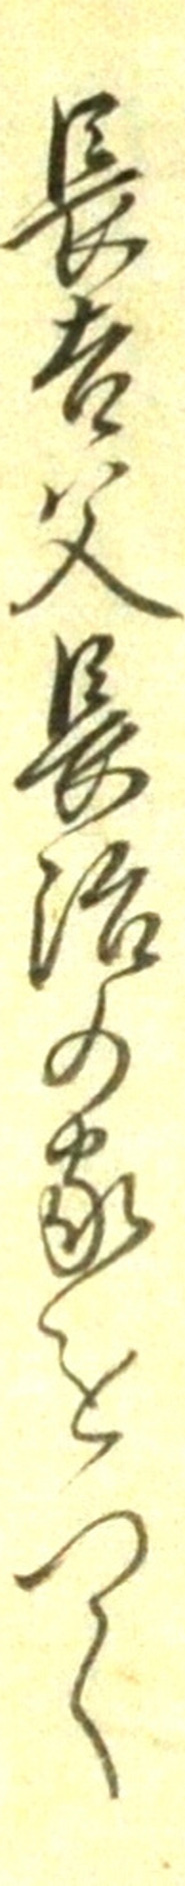長吉父長治の家をつく
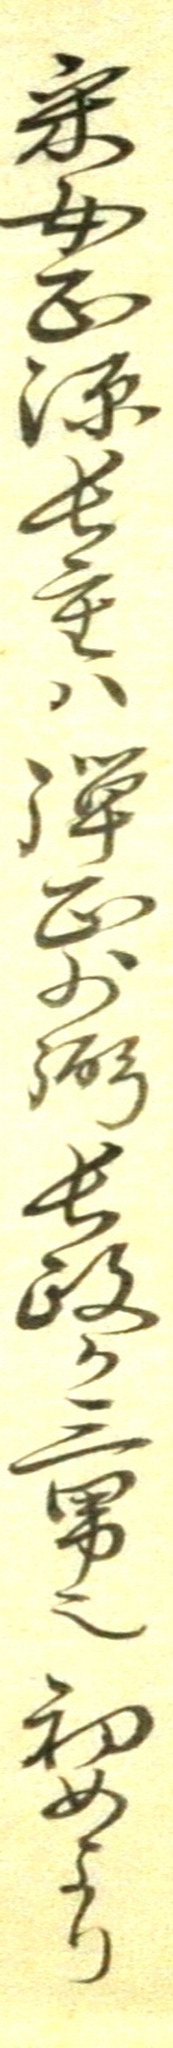采女正源長重は弾正少弼長政か三男也初めより
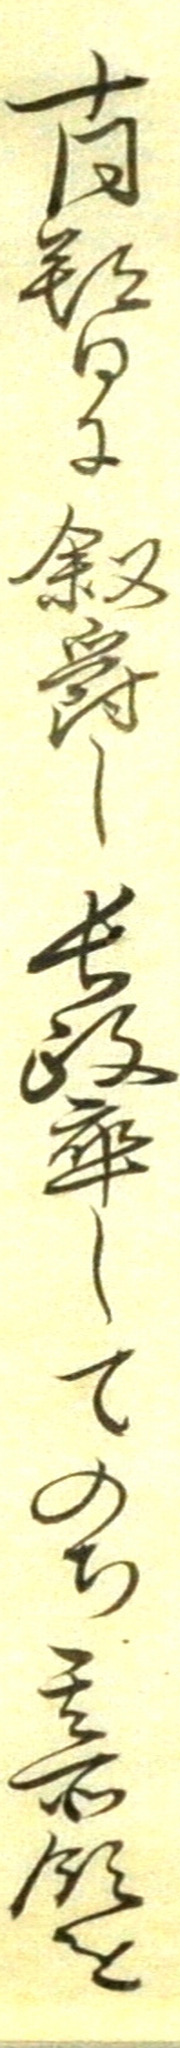十月朔日に叙爵し長政卒してのち其所領を
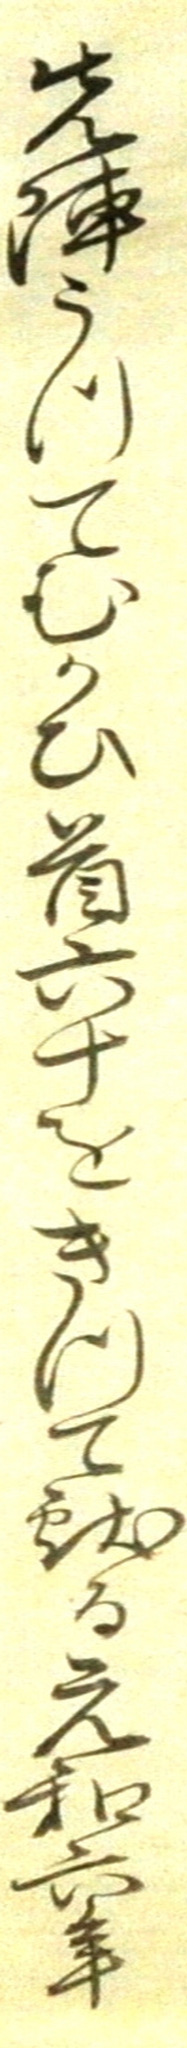先陣うつてむかひ首六十をきつて献る元和六年
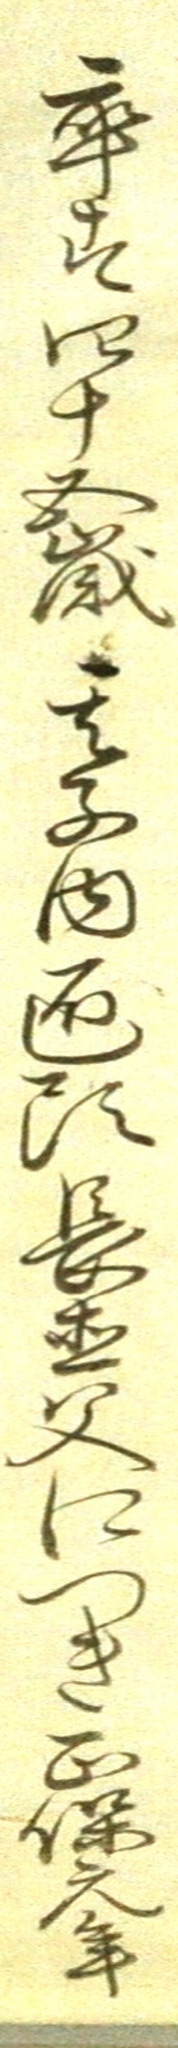卒す四十五歳其子内匠頭長直父につき正保元年
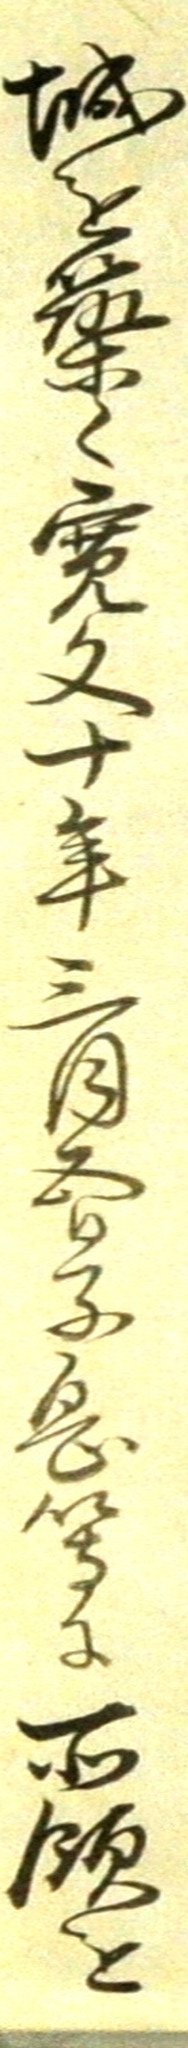城を築く寛文十年三月五日子息等に所領を

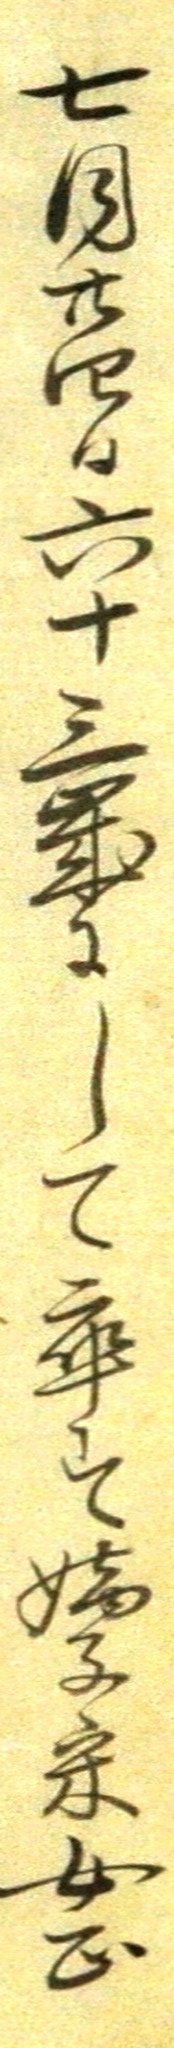七月廿四日六十三歳にして卒す嫡子う采女正
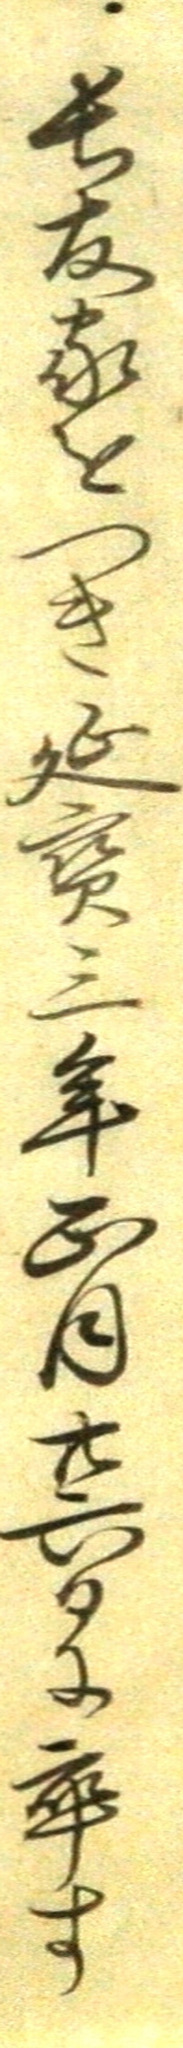長友家をつき延宝三年正月廿六日に卒す
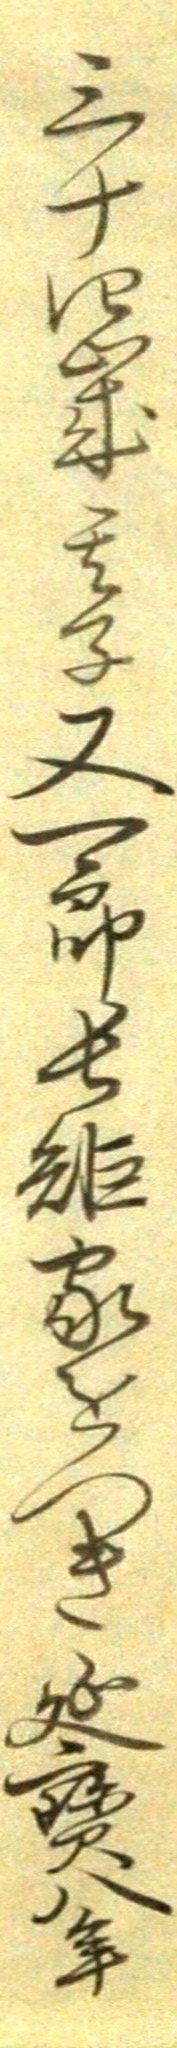三十四歳其子又一郎長矩家をつき延宝八年
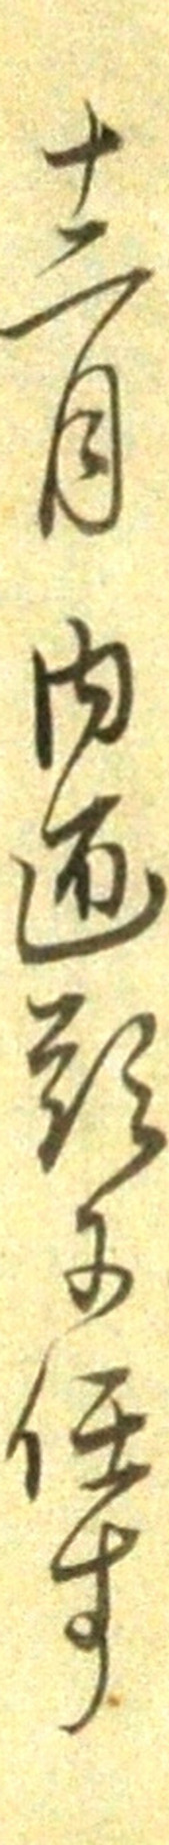十二月内匠頭に任す
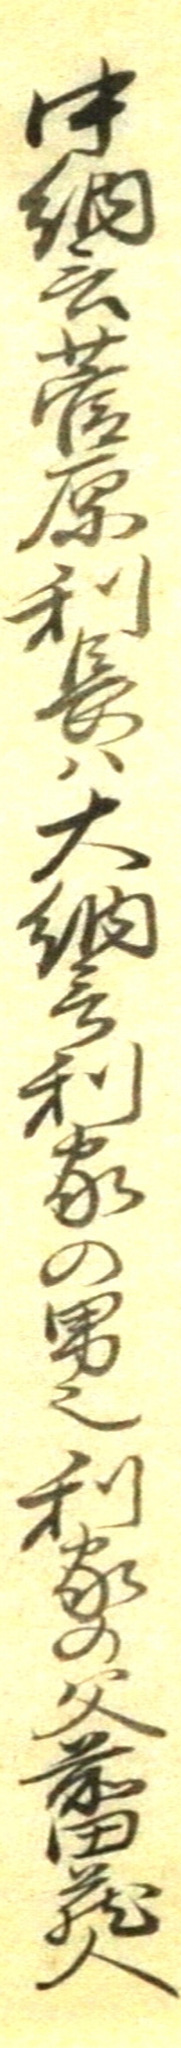中納言菅原利長は大納言利家の男也利家の父前田蔵人
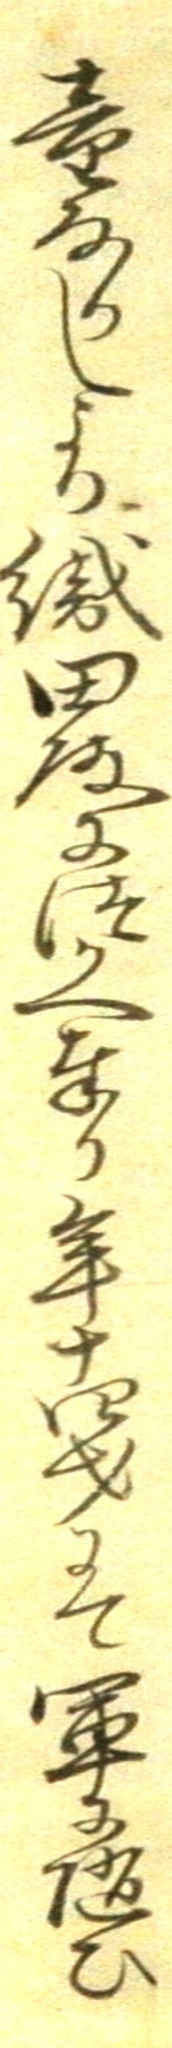童なりしより織田殿につかへ奉り年十四歳にて軍に随ひ

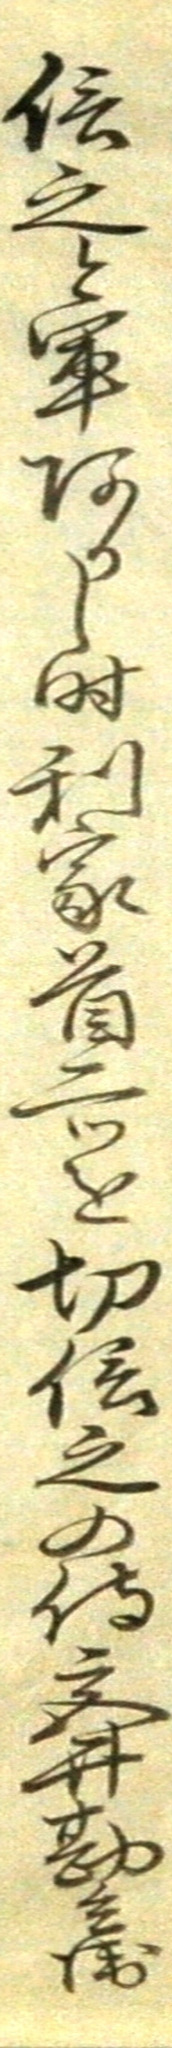信之と軍ありし時利家首二ツを切信之の侍宮井勘兵衛
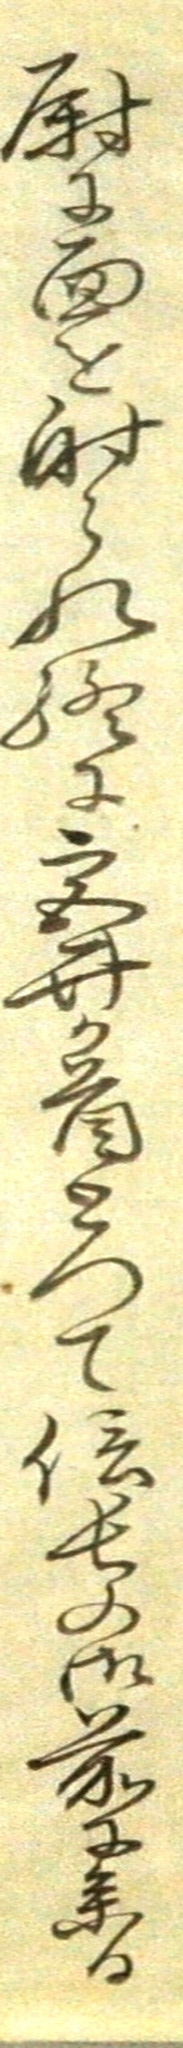尉に面を射られ終に宮井か首とつて信長の御前に参る
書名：藩翰譜（七・上）
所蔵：伊那市立高遠町図書館・合同会社AMANE
